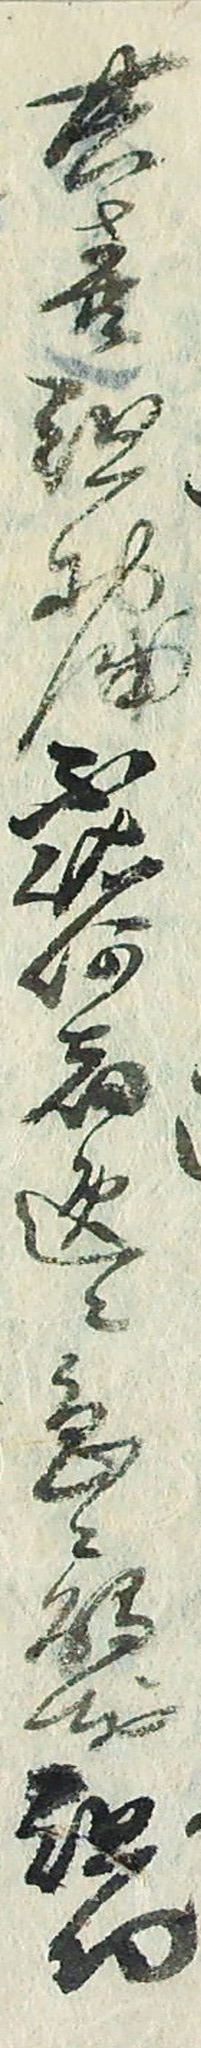其方共組村浦不依何者逸々急々触知組切
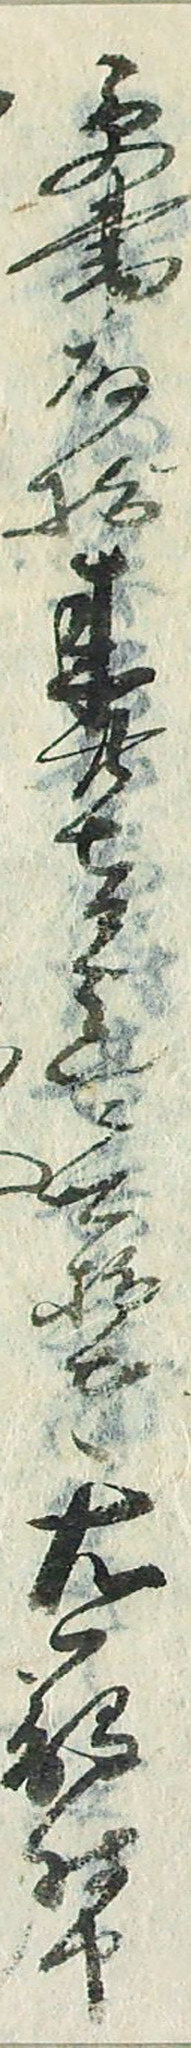受書取揃来廿七日迄に可指出候右御触村中
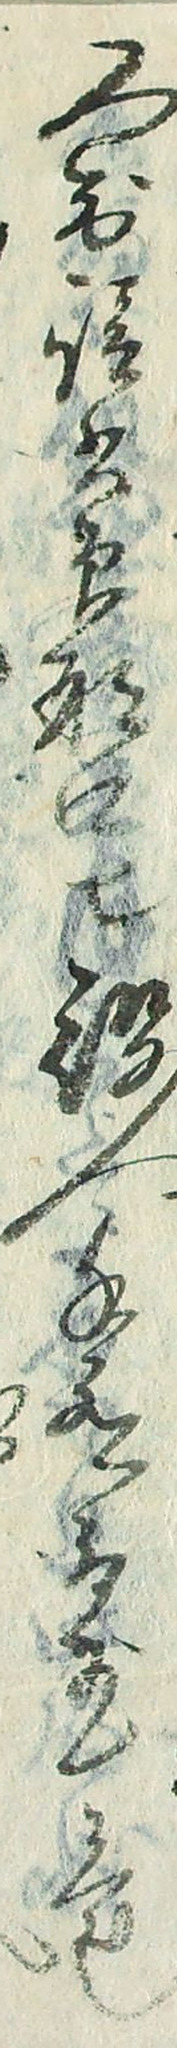人別請書印形仕せ役人手元へ取置壱
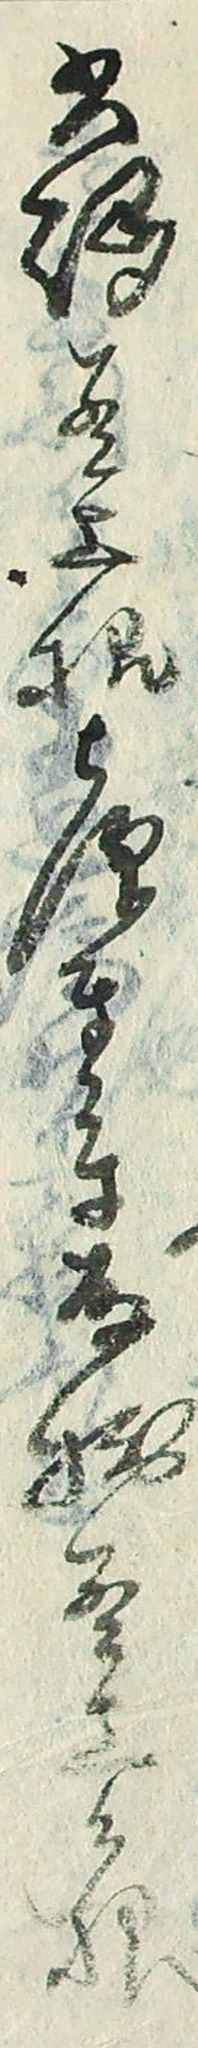書認め差上様被仰付候付取揃差上候様

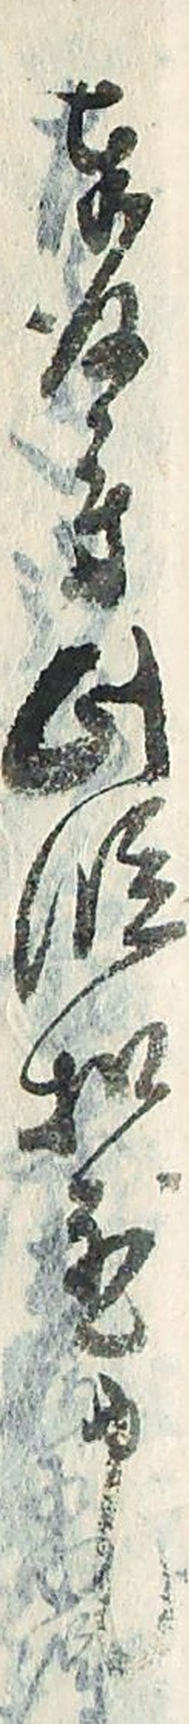奉存候付此段扣置申候
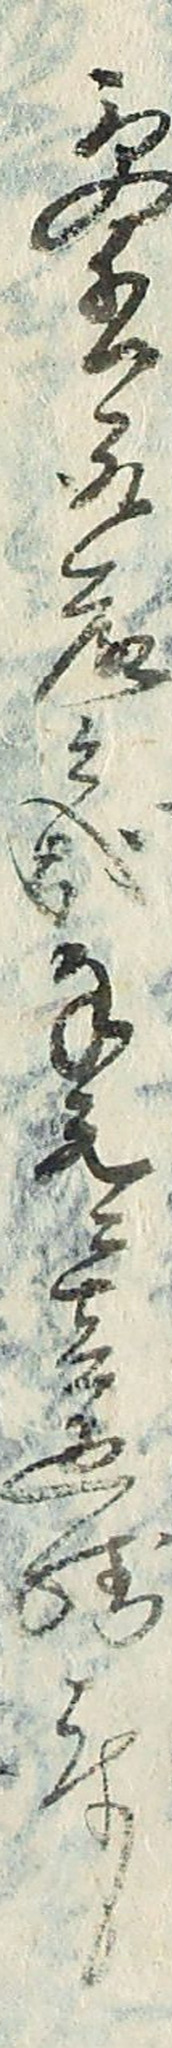受書取落候哉手元に壱通残居候
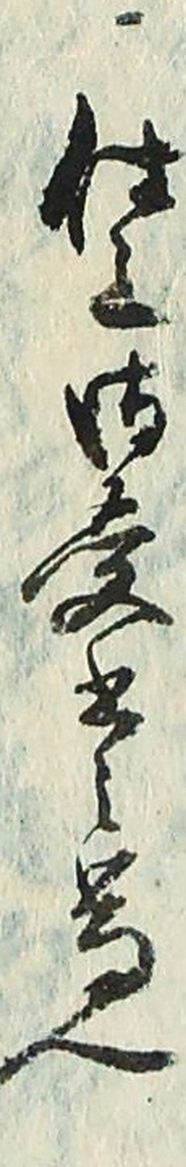仕上御請書之
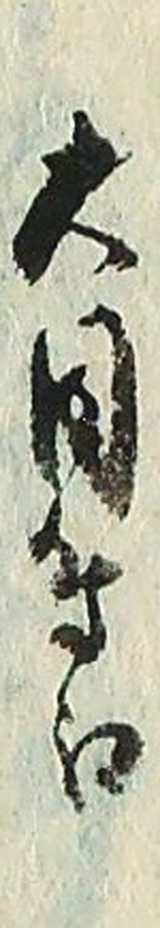大目付江
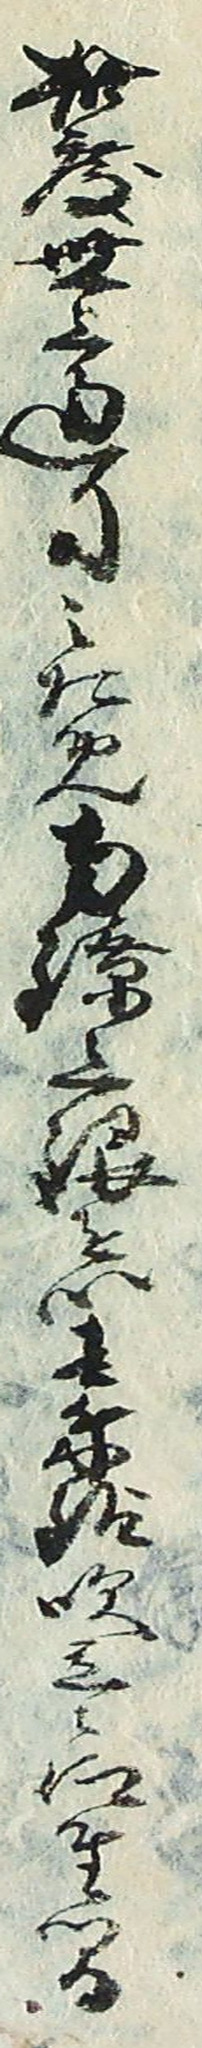此度世上通用之ため南鐐上銀を以壱朱銀吹立被仰付候間
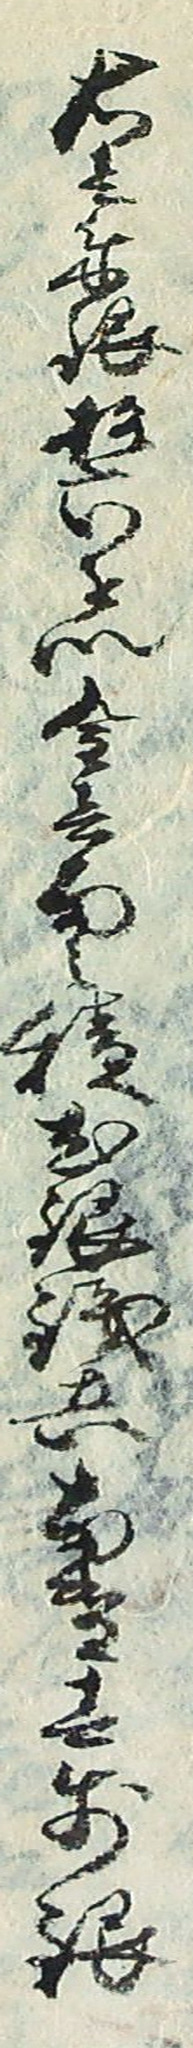右壱朱銀拾六を以金壱両之積尤銀銭共両替壱歩銀
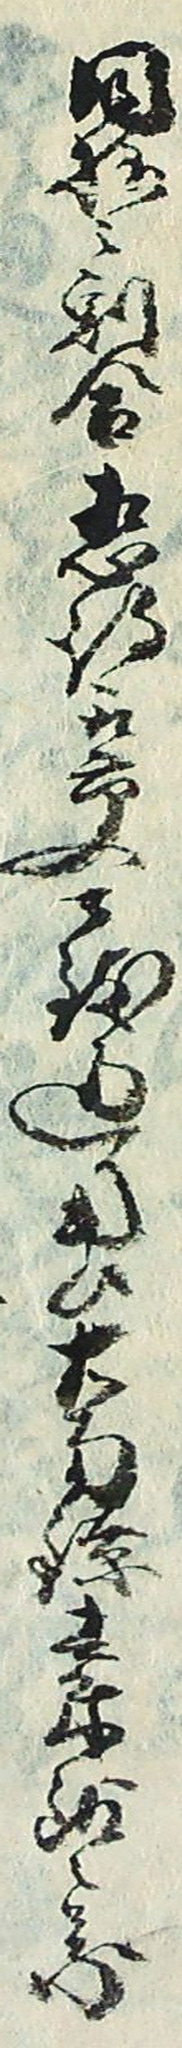同様之割合相心得取交可致通用候右南鐐壱朱銀之義
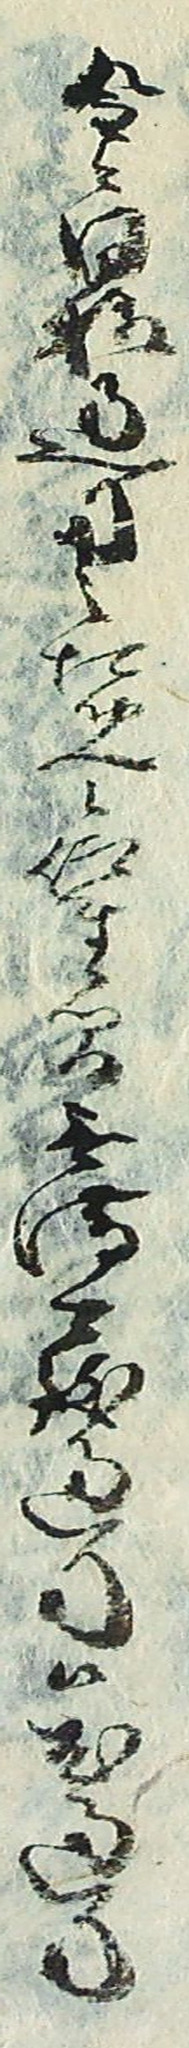金と同様通用之ため被仰付候間無滞可致通用候尤通用
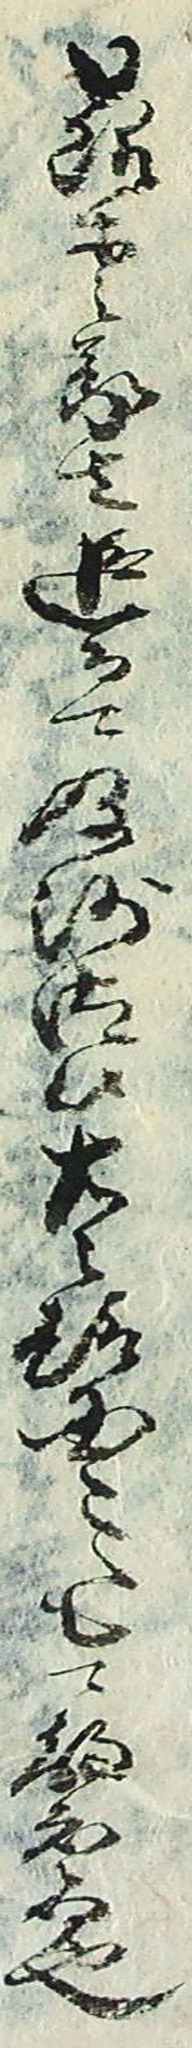日限等之義は追而可及沙汰候右之趣国々へも可触知者也
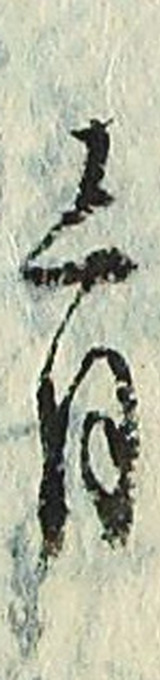十二月
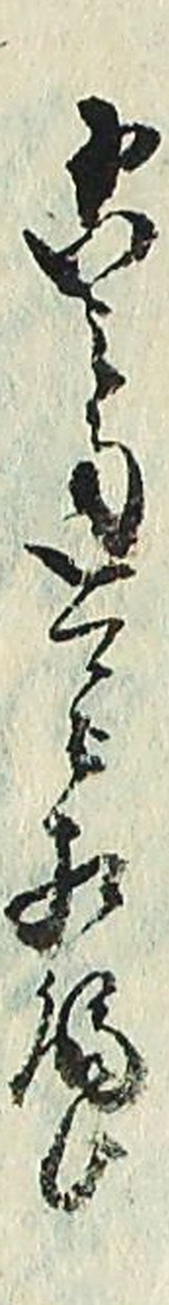右之通可被相触候
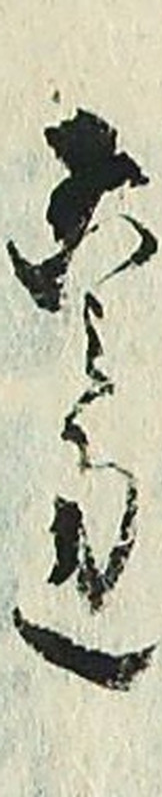右之通
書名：諸御用御□受書控
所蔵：鳴門教育大学 Naruto University of Education
